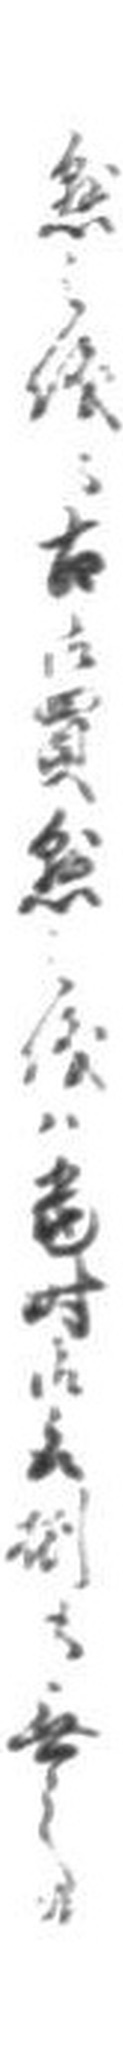懸之儀も右御買懸之儀ハ当時御取捌も無之候

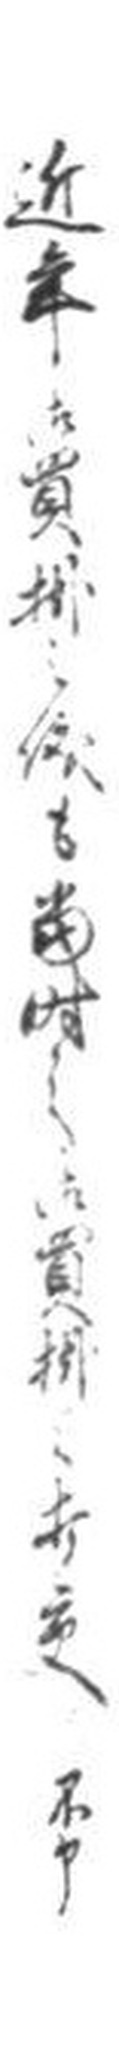近年御買掛之儀も当時之御買掛之折受不申
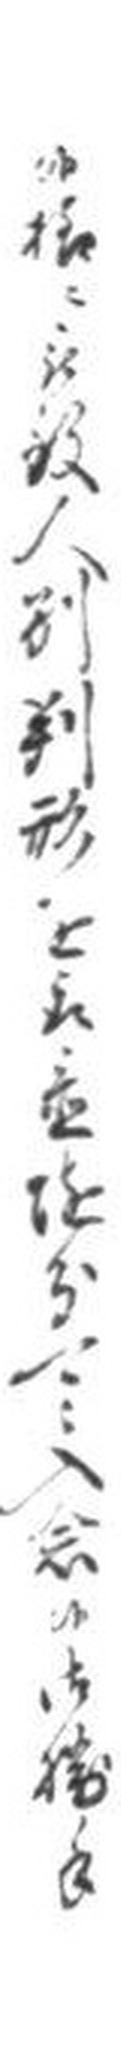候様ニ被致人別判形を取置随分可被入念候御勝手
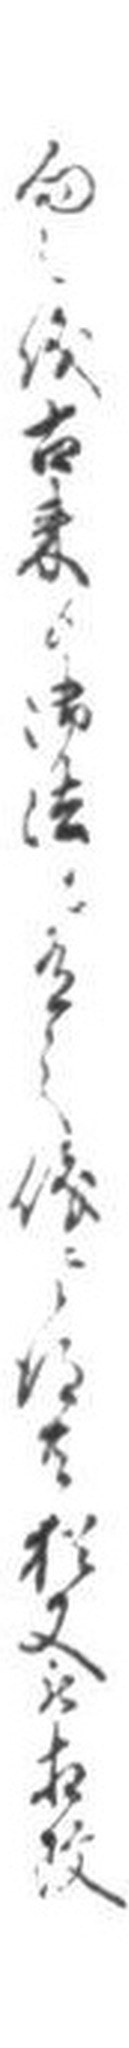向之儀古来ゟ御法も有之儀ニ候得共猶又被相改
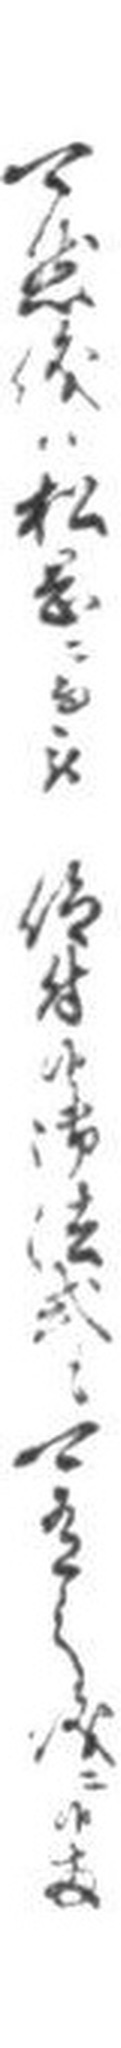可然儀ハ松岡ニ而被仰付候御法式も可有之儀ニ候両
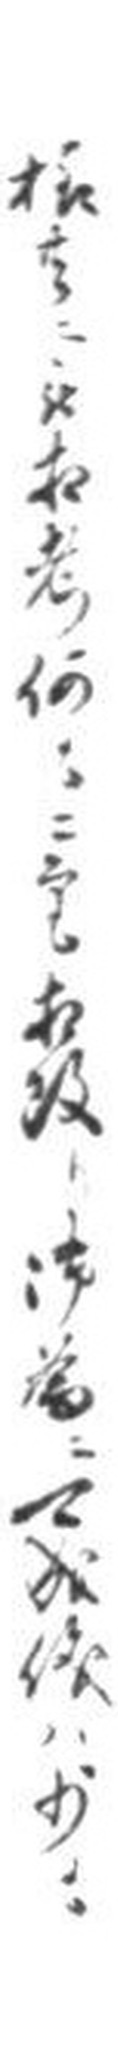様共ニ被相考何らニ而も相改も御為ニ可成儀ハ少も
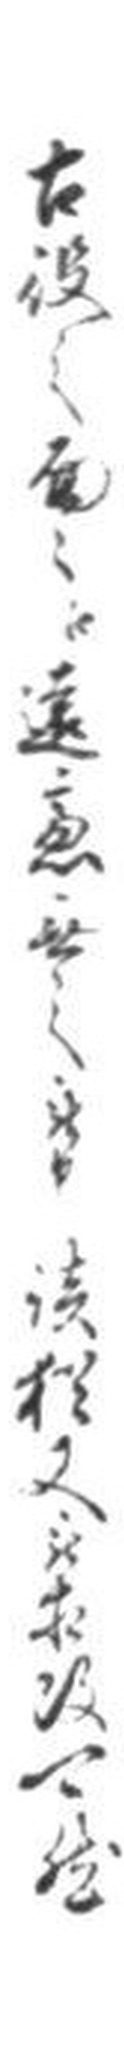古役之面々江遠慮無之被申談猶又被相改可然
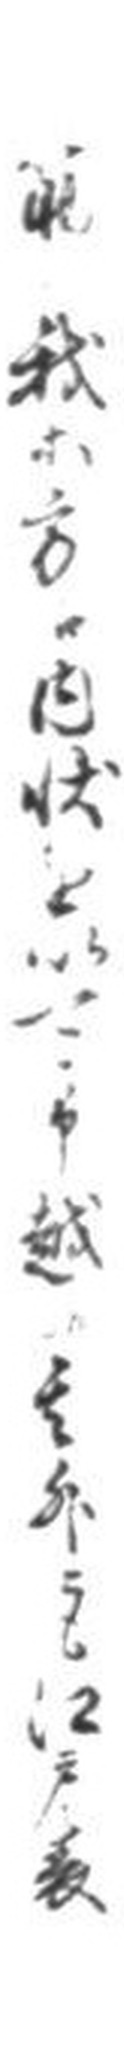我等方江内状を以可被申越候其外ニも江戸表
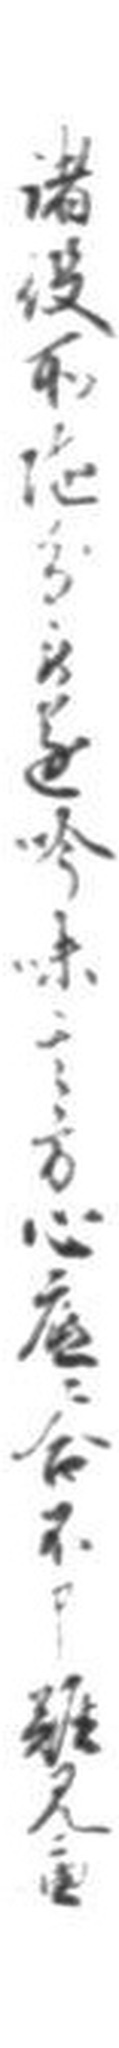諸役所随分被遊吟味其方心底ニ合不申難見届
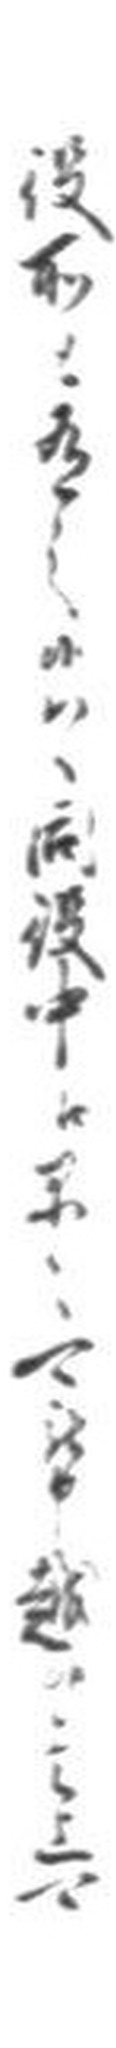役所も有之候ハゝ同役中江品々可被申越候言上可
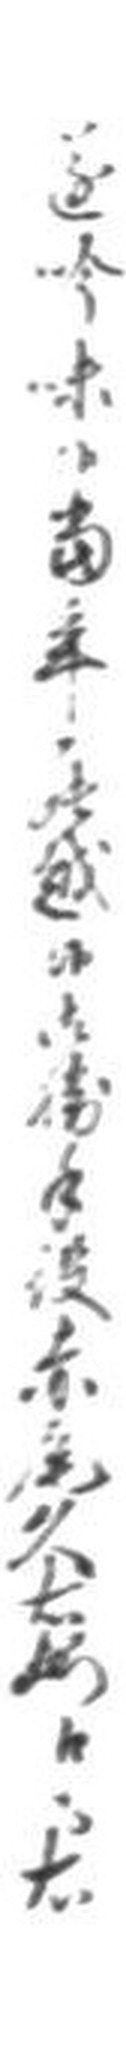遊吟味候当年罷越候御勝手役赤尾久右衛門江も右
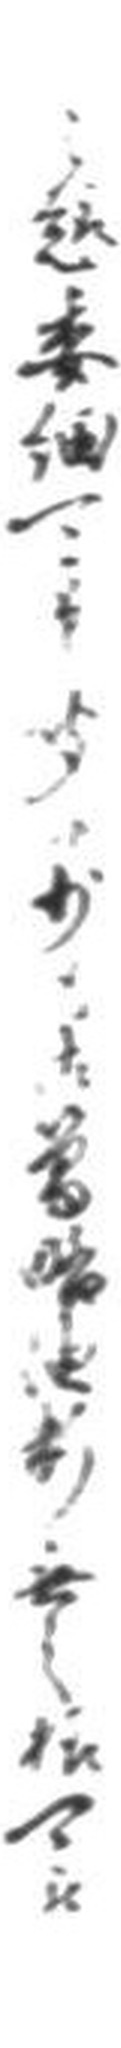之趣委細可被申聞候少も御簡略油断無之様可被
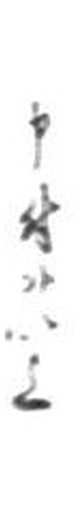申付候以上
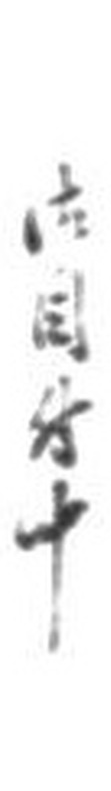御目付中
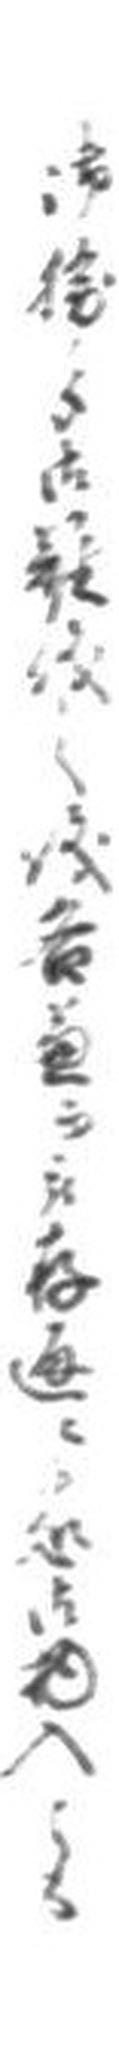御勝手御疑儀之儀各兼而被存通ニ候処御物入之
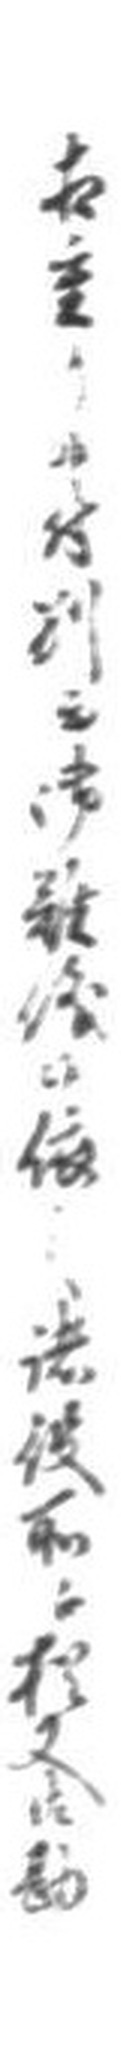相重り候ニ付別而御難儀候依之諸役所江猶又御勘
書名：家譜 三十九 宗矩公 享保十年
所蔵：福井県文書館 Fukui Prefectural Archives
